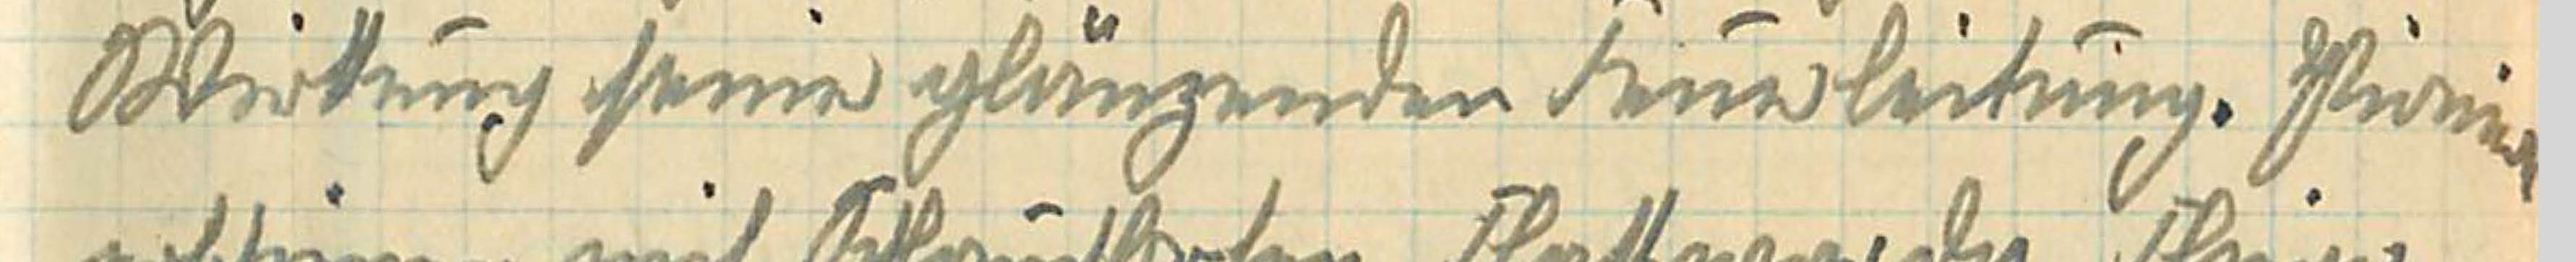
Wirkung seiner glänzenden Feuerleitung. Pioniere
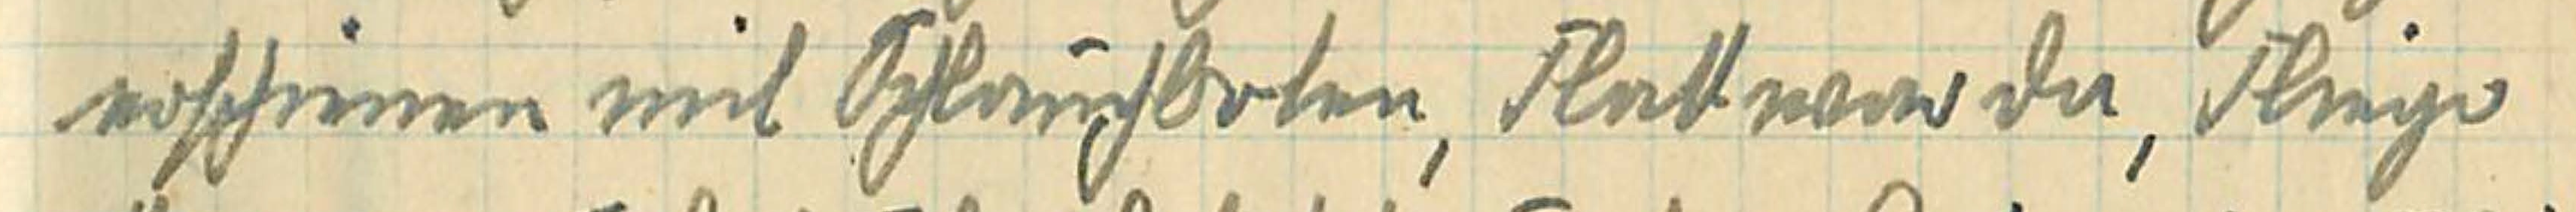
erschienen mit Schlauchboten, Flak war da, Flieger
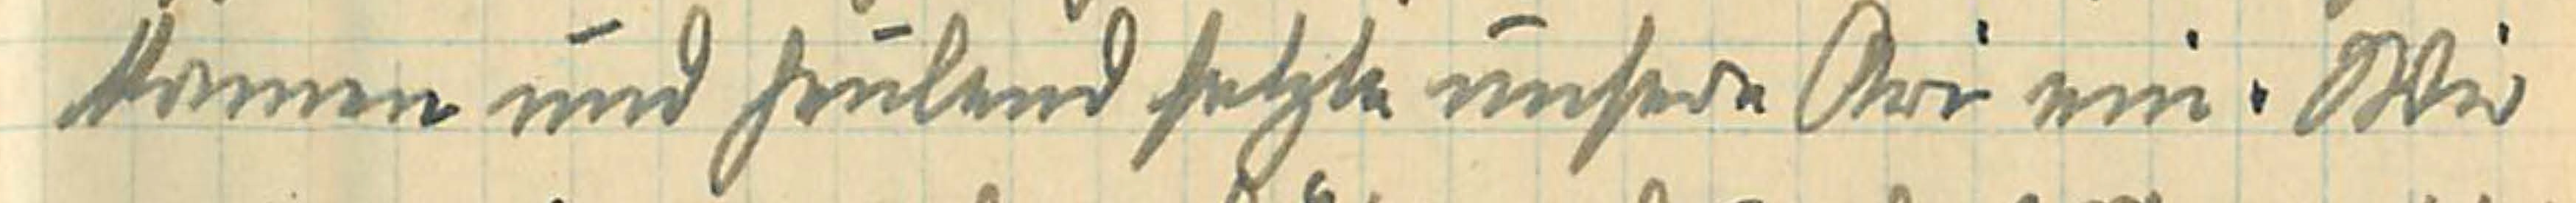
kamen und heulend setzte unsere Ari ein. Wir
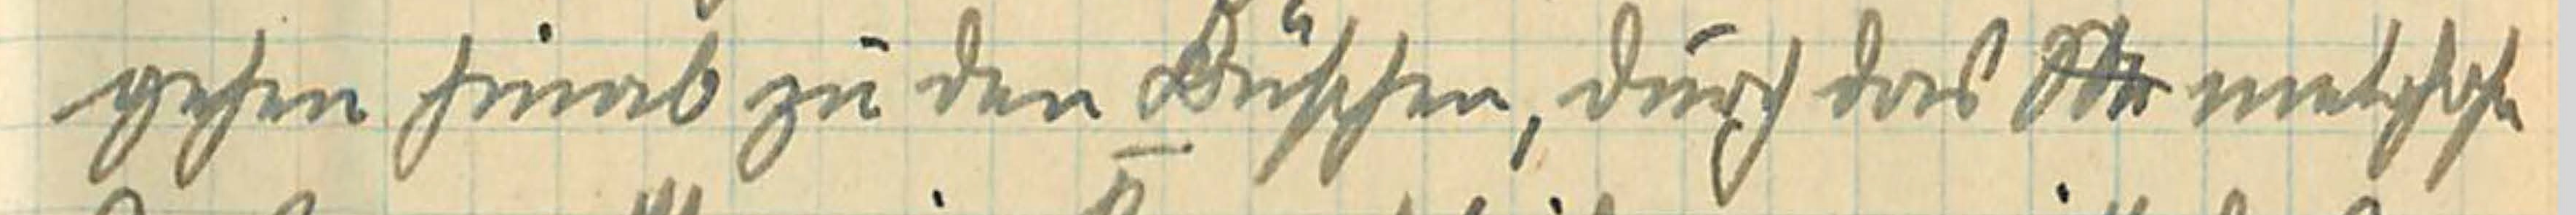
gehen hinab zu den Büschen, durch das Me meterhohe
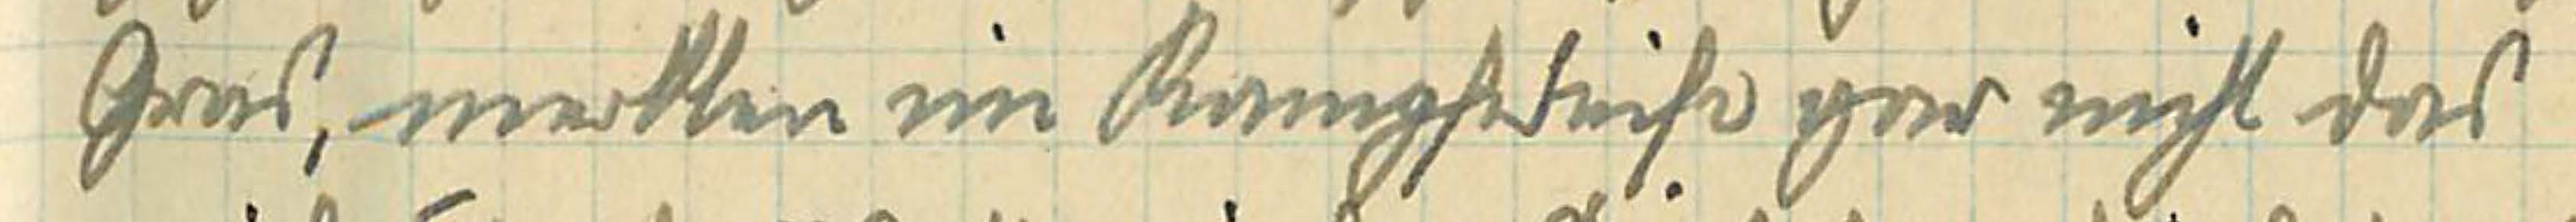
Gras, merkten im Kampfeseifer gar nicht das
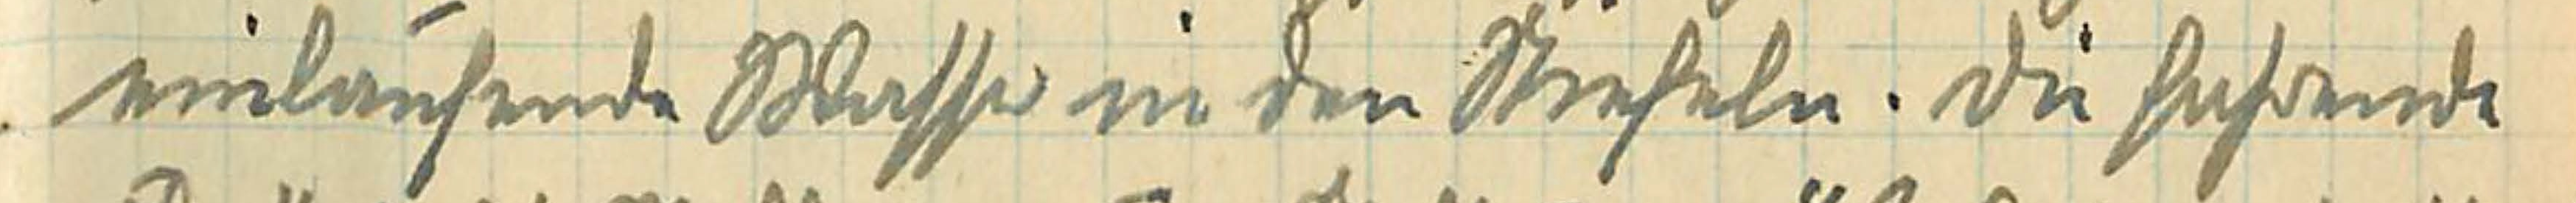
einlaufende Wasser in den Stiefeln. Die fahrende
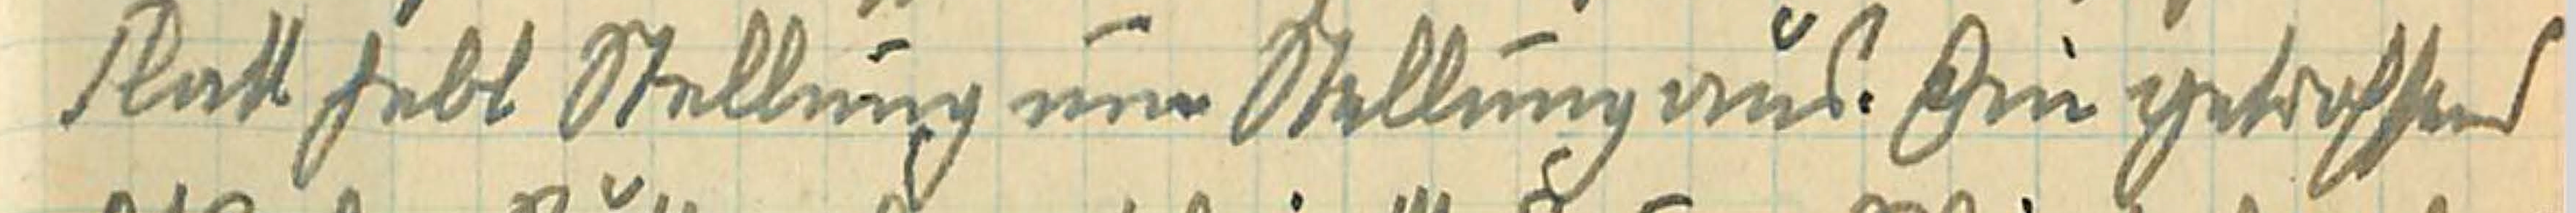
Flak hebt Stellung um Stellung aus. Ein getroffenes
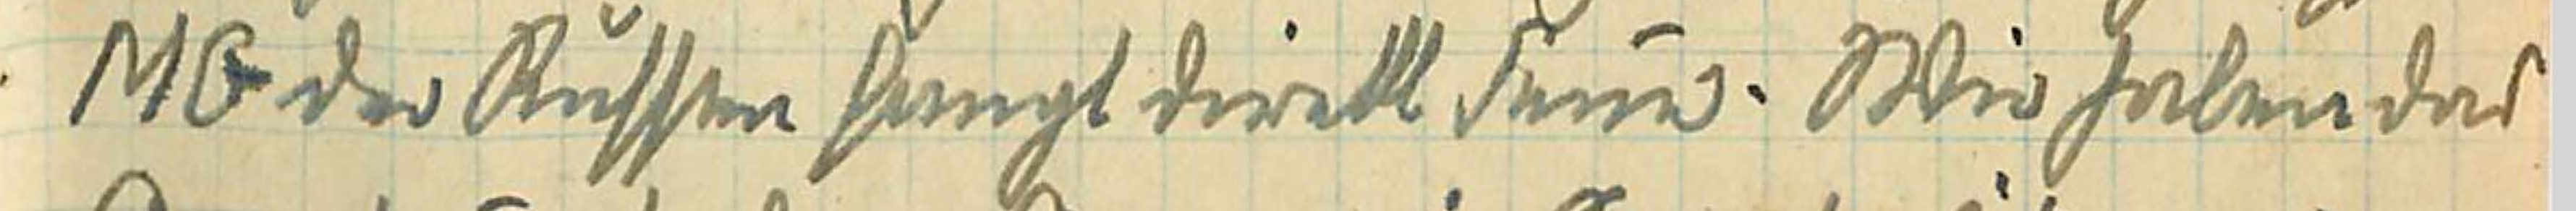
MG der Russen fängt direkt Feuer. Wir haben das
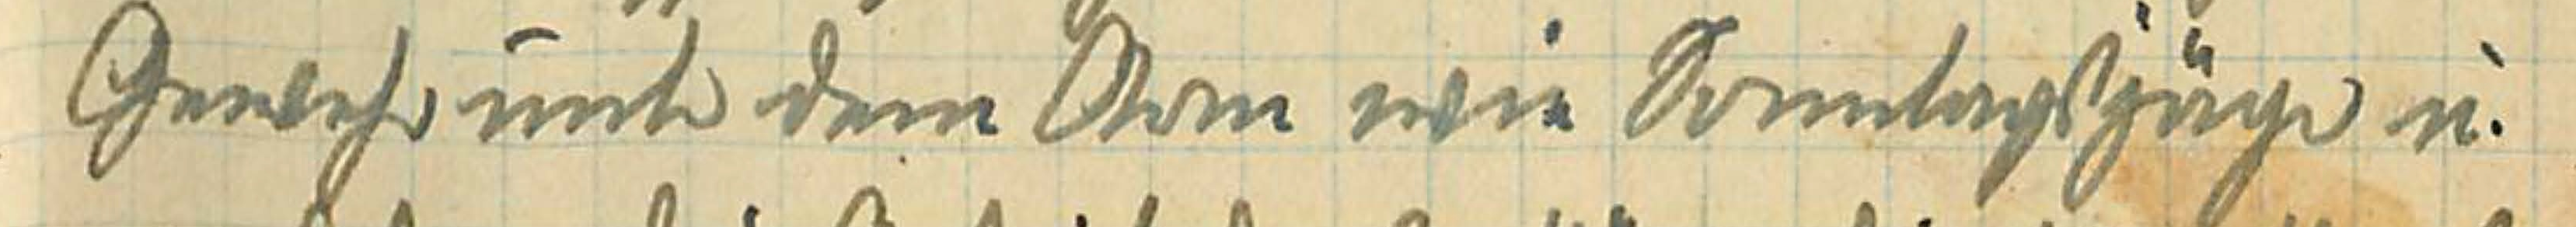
Gewehr unter dem Arm wie Sonntagsjäger u.
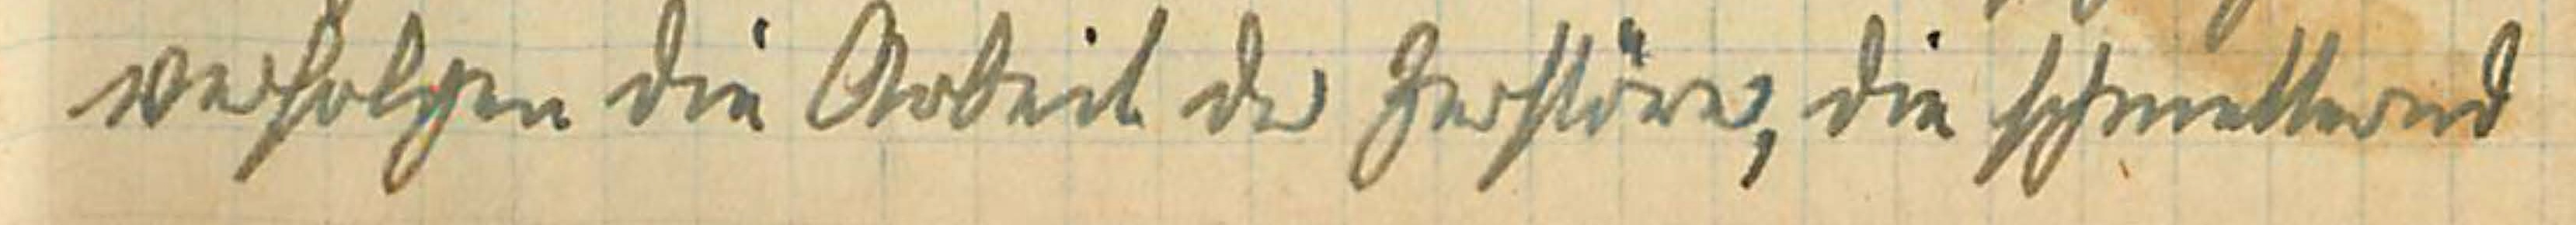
verfolgen die Arbeit der Zerstörer, die schmetternd
